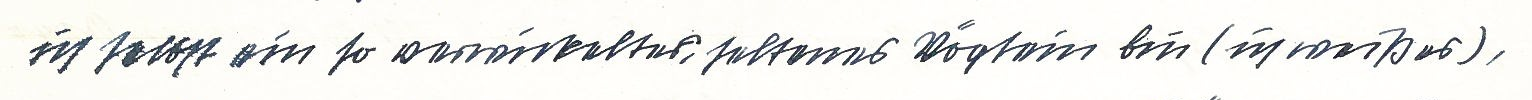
ich selbst ein so verwickeltes, seltenes Vöglein bin (ich weiß es),
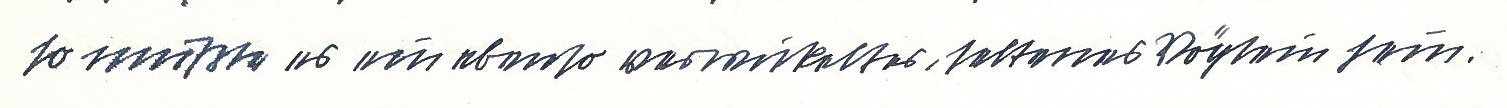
so müßte es ein ebenso verwickeltes, seltenes Vöglein sein.
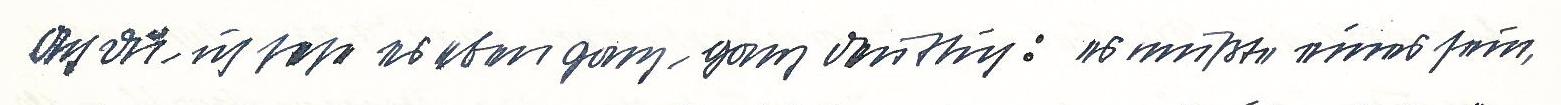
Ach Du, ich sehe es eben ganz, ganz deutlich: es mußte eines sein,
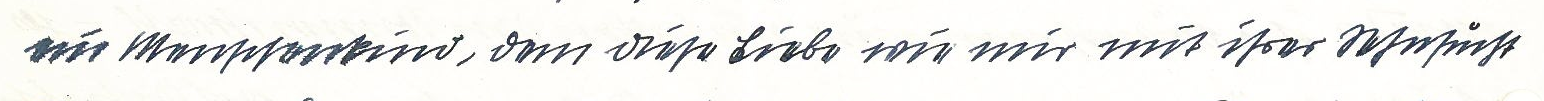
ein Menschenkind, dem diese Liebe wie mir mit ihrer Sehnsucht
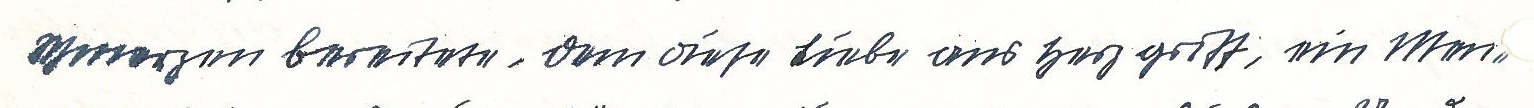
Schmerzen bereitete, dem diese Liebe ans Herz griff, ein Men¬
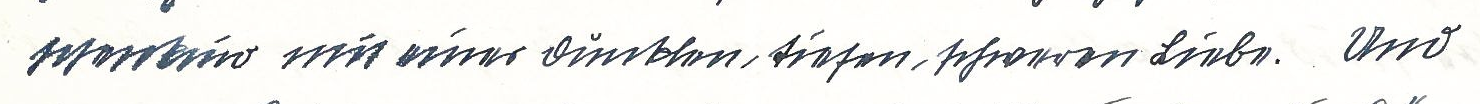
schenkind mit einer dunklen, tiefen, schweren Liebe. Und
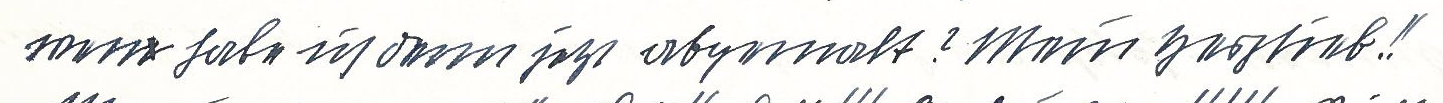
wen habe ich denn jetzt abgemalt? Mein Herzlieb!!
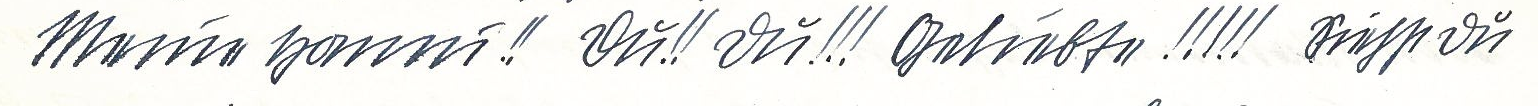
Meine !! Du!! Du!!! Geliebte!!!!! Siehst Du
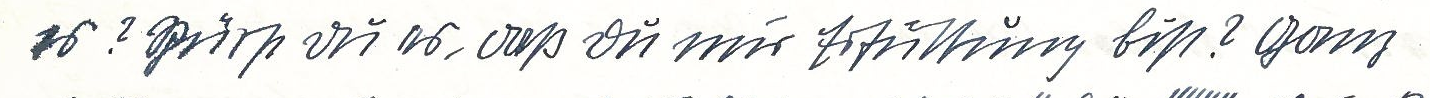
es? Spürst Du es, daß Du mir Erfüllung bist? Ganz
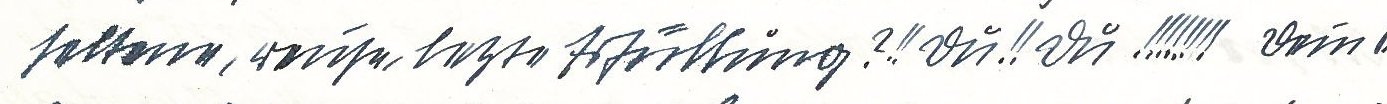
seltene, reiche, letzte Erfüllung?!! Du!! Du!!!!!!!! Dein
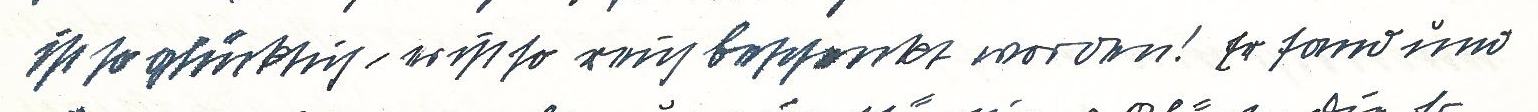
ist so glücklich, er ist so reich beschenkt worden! Er fand und
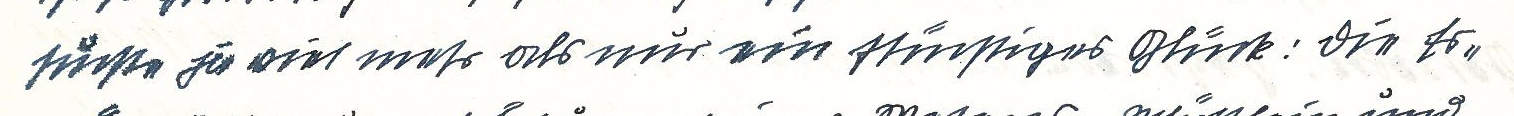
suchte ja viel mehr als nur ein flüchtiges Glück: Die Er¬
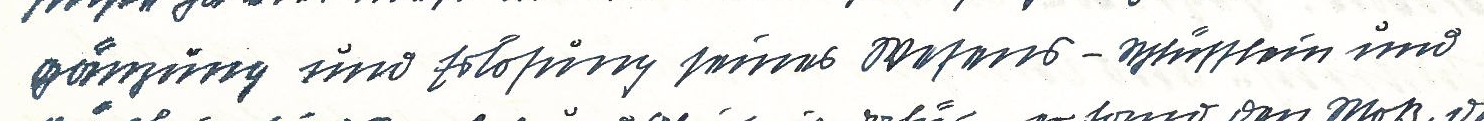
gänzung und Erlösung seines Wesens – Schlüsslein und
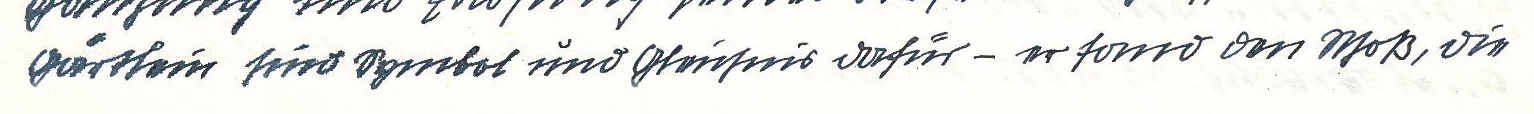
Gärtlein sind Symbol und Gleichnis dafür – er fand den Schoß, die
